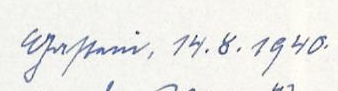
Grastein, 14. 8. 1940.
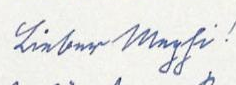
Lieber Mephi!
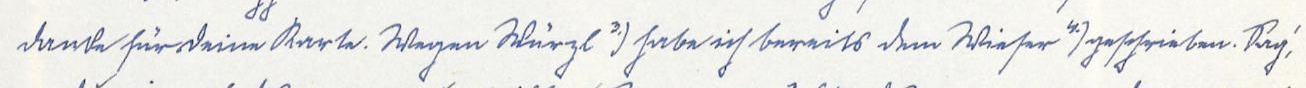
Danke für deine Karte. Wegen Würzl.3) habe ich bereits dem Wieser 4) geschrieben. Sag,
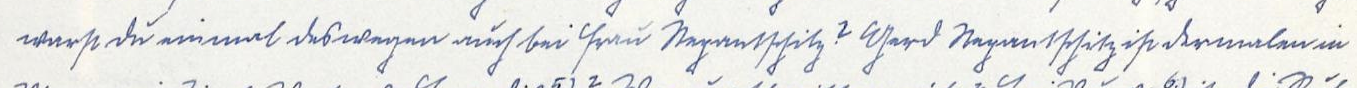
warst du einmal deswegen auch bei Frau Stepantschitz? Gere Stepantschitzitz dermalen in
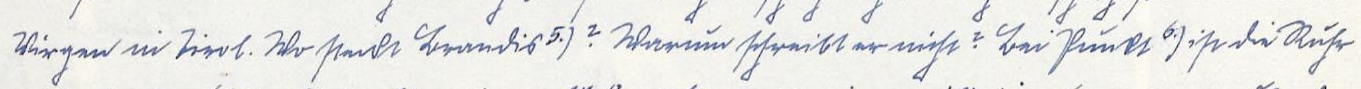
Virgen in Tirol. Wo steckt Brandis 25)? Warum schreibt er nicht? Bei Punkt 6) ist die Ruhr
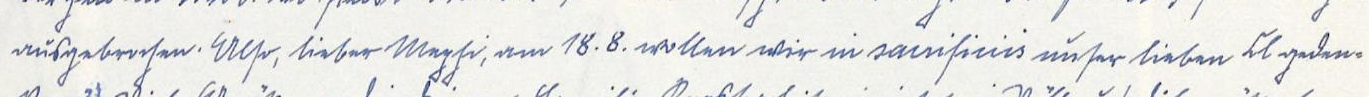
ausgebrochen. Also, lieber Mephi, am 18. 8. wollen wir im sacrificis unser lieben Cl geden-
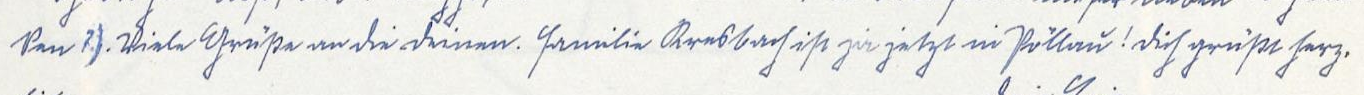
ken . Viele Grüße an die deinen. Familie Kresbach ist ja jetzt in Pöllau! dich grüßt herz-
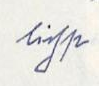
lichst
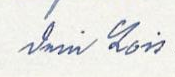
Dein Lois.
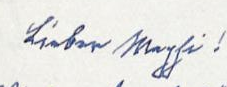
Lieber Mephi
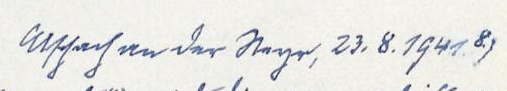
Aschach an der Steyr, 20. 8. 1941 8)
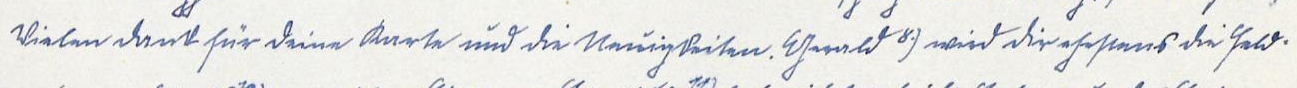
Vielen Dank für deine Karte und die Neuigkeiten. Gerald 9) wird dir ehestens die Feld-
